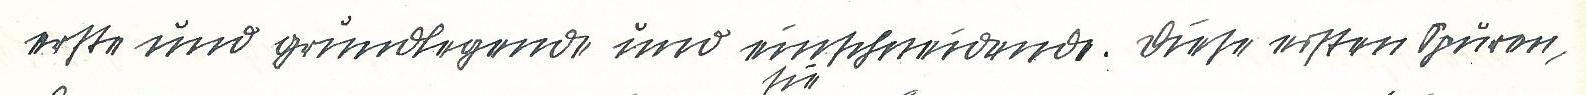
erste und grundlegende und einschneidende. Diese ersten Spuren,
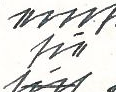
sie
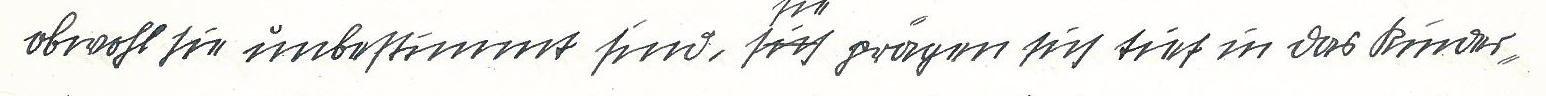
obwohl sie unbestimmt sind, sich prägen sich tief in das Kinder¬
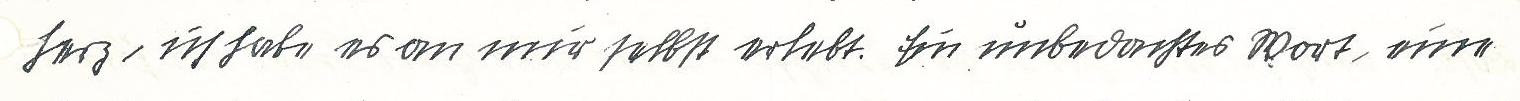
herz, ich habe es an mir selbst erlebt. Ein unbedachtes Wort, eine
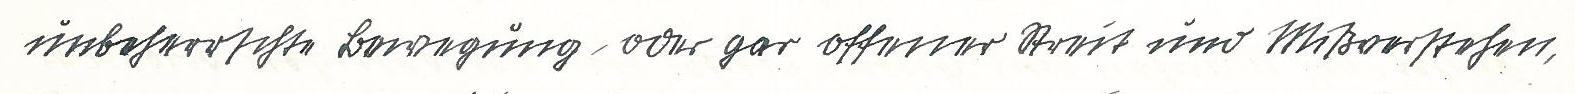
unbedachte Bewegung, oder gar offener Streit und Mißverstehen,
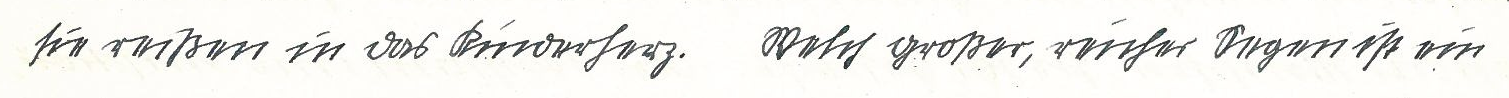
sie reißen in das Kinderherz. Welch großer, reicher Segen ist ein
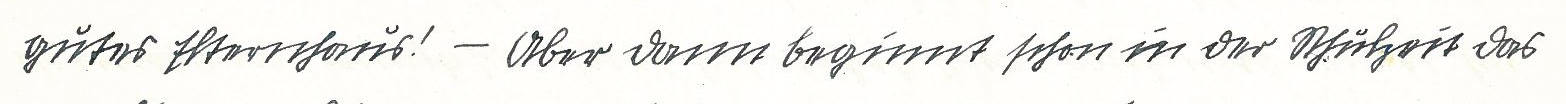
gutes Elternhaus! – Aber dann beginnt schon in der Schulzeit das
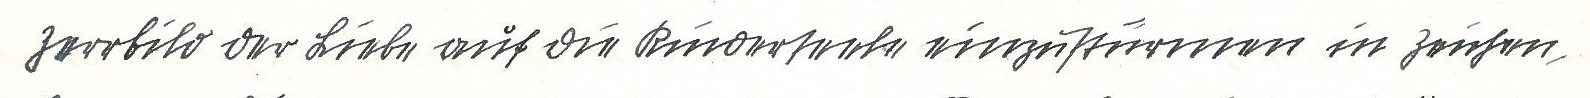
Zerrbild der Liebe auf die Kinderseele einzustürmen in Zeichen,
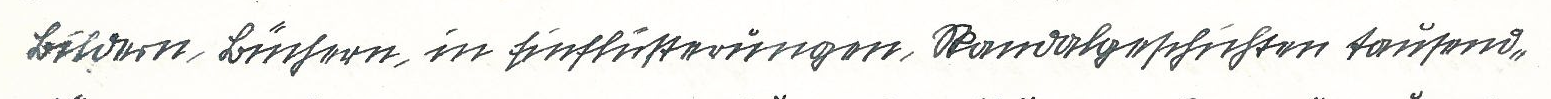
Bildern, Büchern, in Einflüsterungen, Skandalgeschichten tausend¬
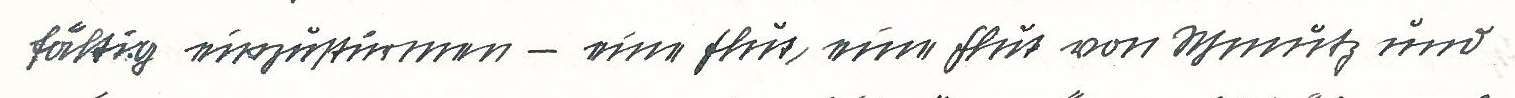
fältig einzustürmen – eine Flut, eine Flut von Schmutz und
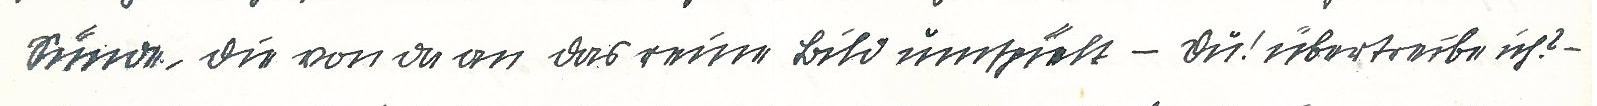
Sünde, die von da an das reine Bild umspült – Du! übertreibe ich? –
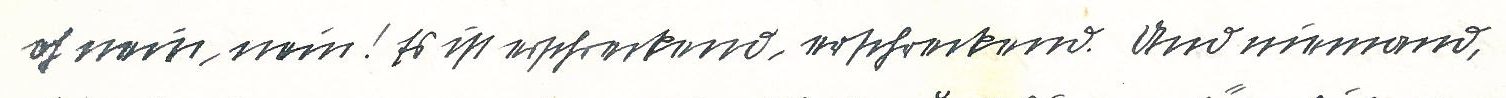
oh nein, nein! Es ist erschreckend, erschreckend. Und niemand,
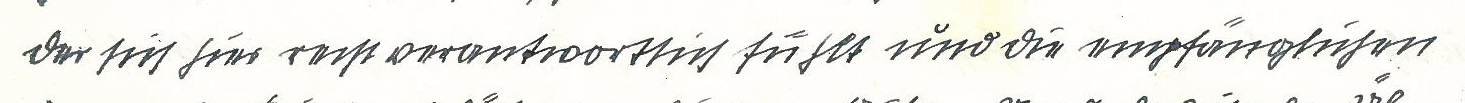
der sich hier recht verantwortlich fühlt und die empfänglichen
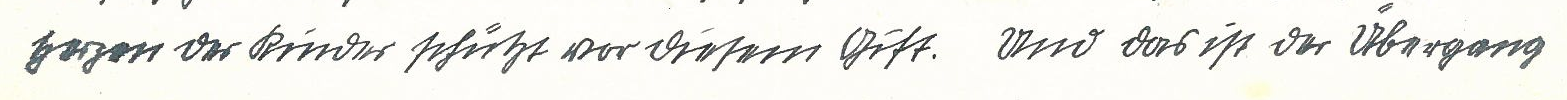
Herzen der Kinder schützt vor diesem Gift. Und das ist der Übergang
